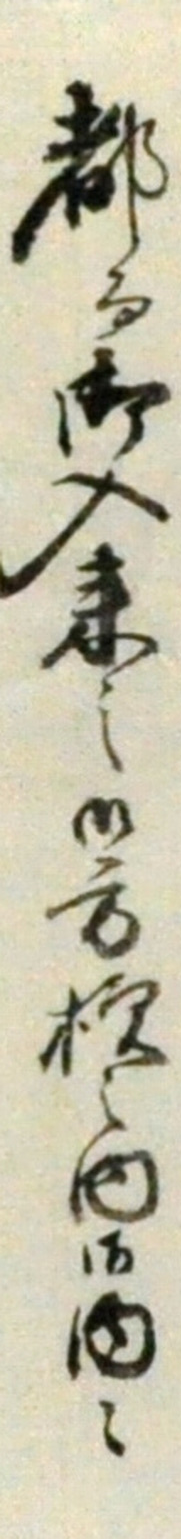都て御入来之御方様之内御内々
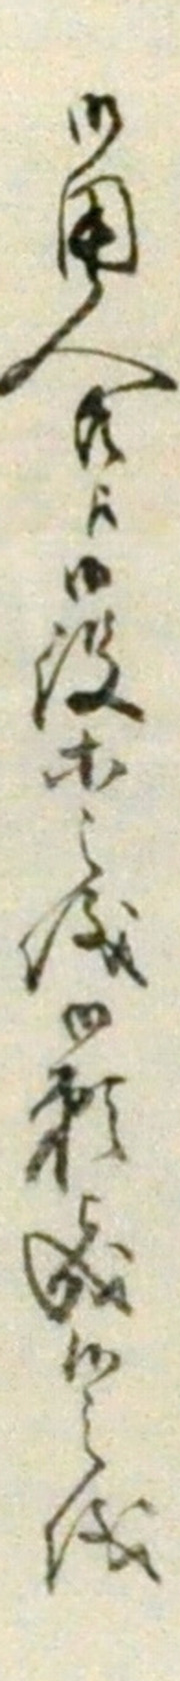御用人共え御役等之儀御願被成候之儀
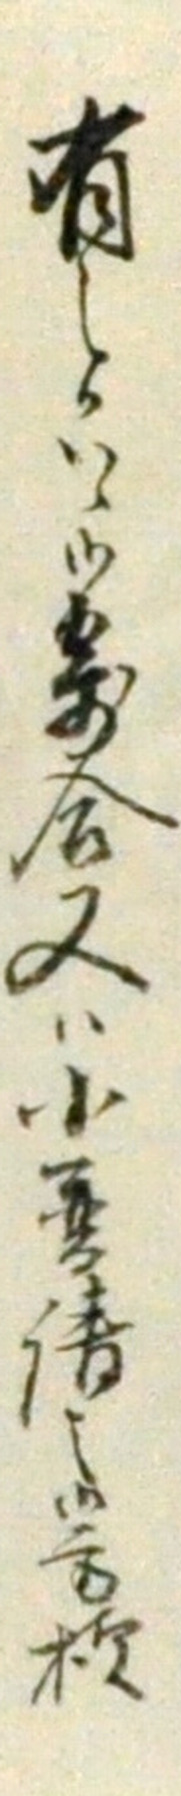有之候はゝ御寄合又は小普請之御方様
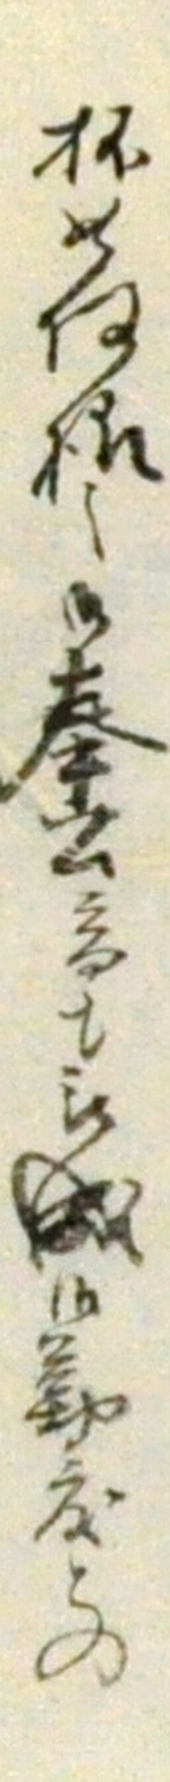抔如何様之御奉公にても被成御勤度との
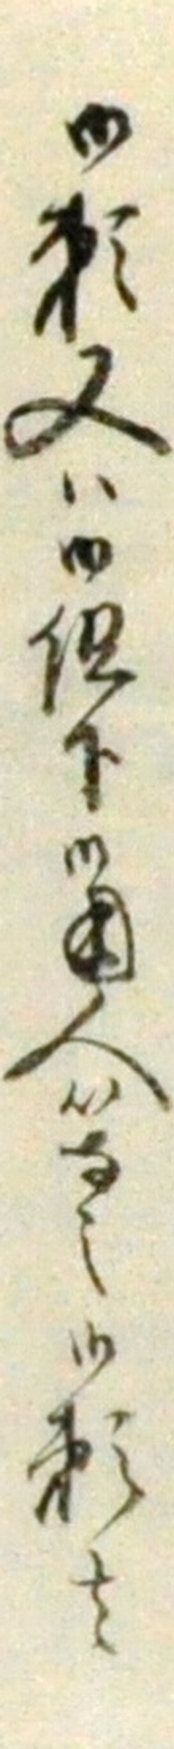御頼又は御組下御用人等之御頼は
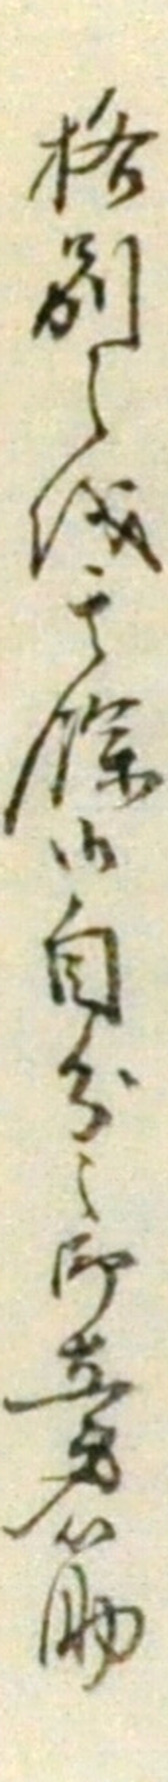格別之儀其余御自分之御立身筋
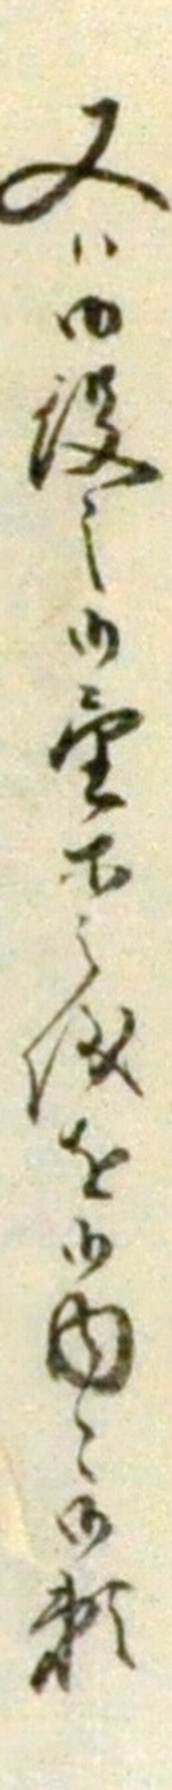又は御役之御望等之儀を御内々御頼
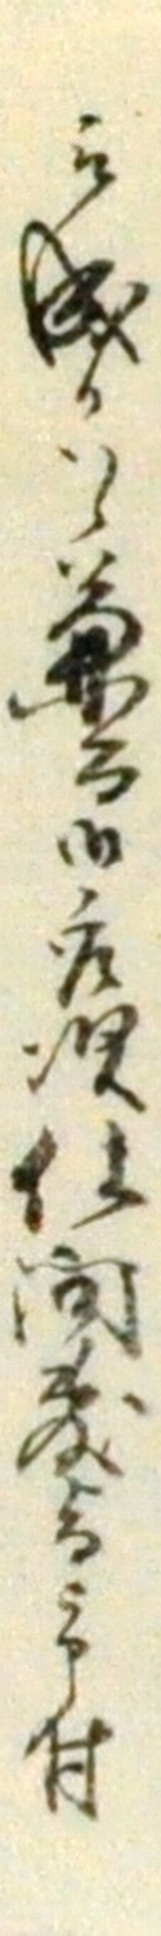被成候はゝ兼て御取次仕間敷旨に申付
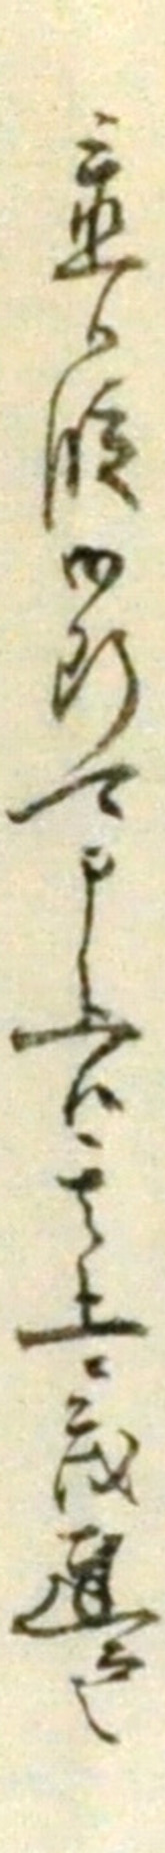置候段御断可申上候其上にも達て之
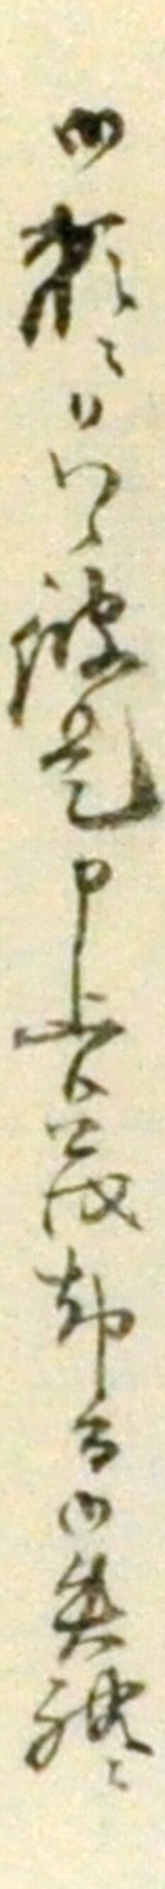御頼に候はゝ彼是申上候も却て御失礼に
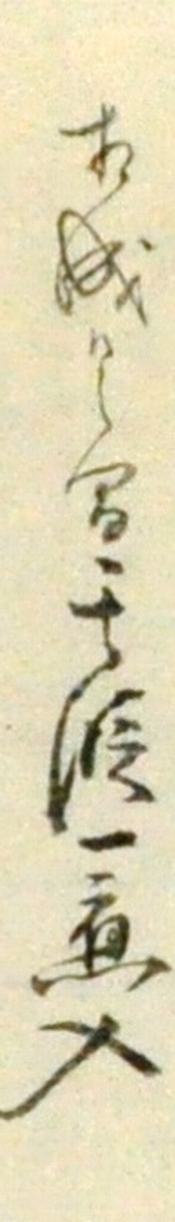相成候之間其段一応入
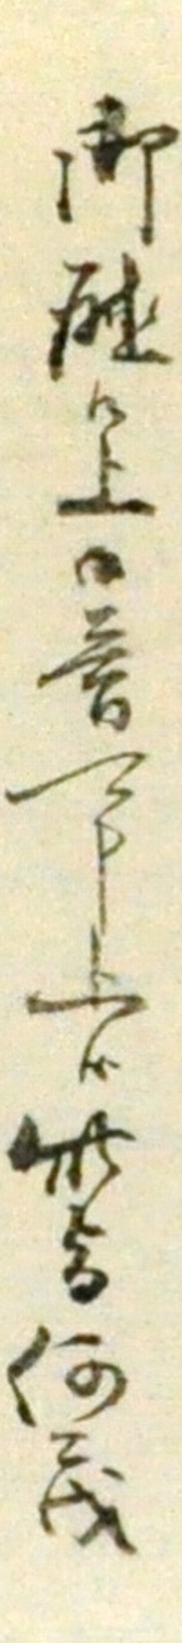御聴候上御答可申上候此旨何も
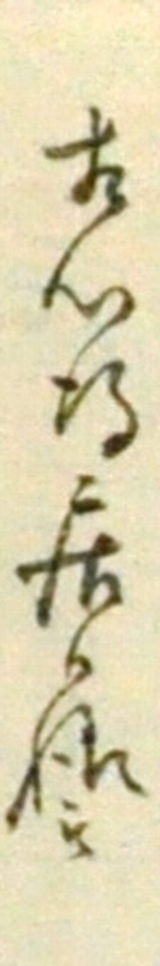相心得居候様被
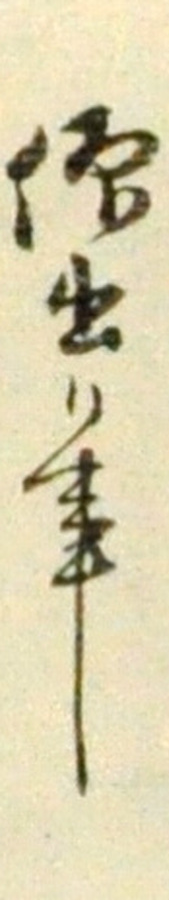仰出候事
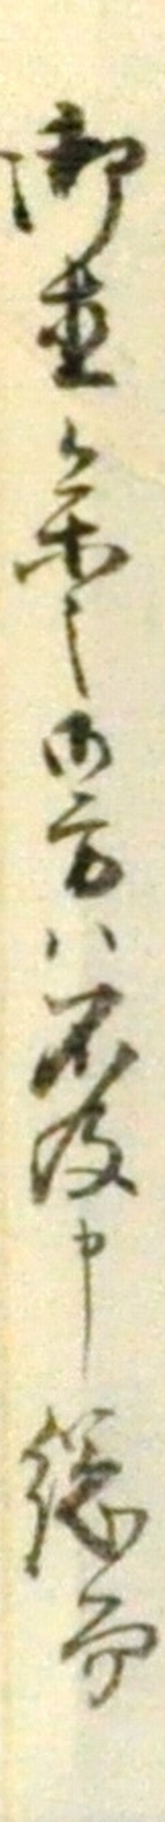御直参之御方は不及申総て
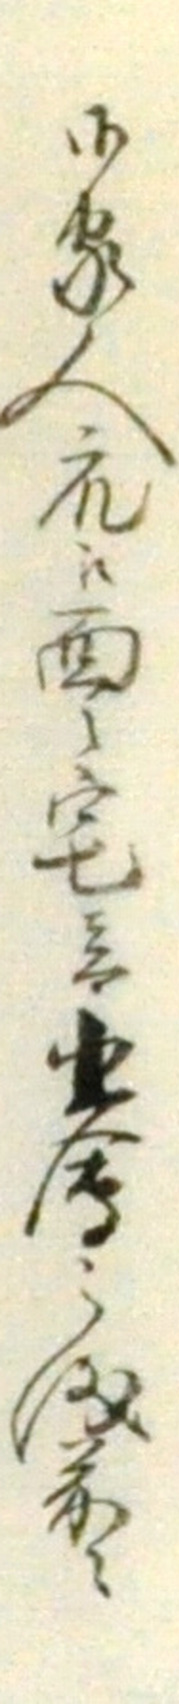御家人衆え面々宅にて出会之儀前々
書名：公用人ヘ
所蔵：伊那市立高遠町図書館・合同会社AMANE
